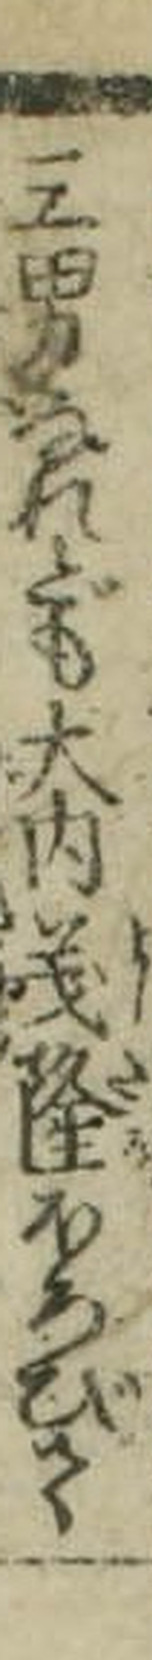三男なれども大内義隆ほろびて
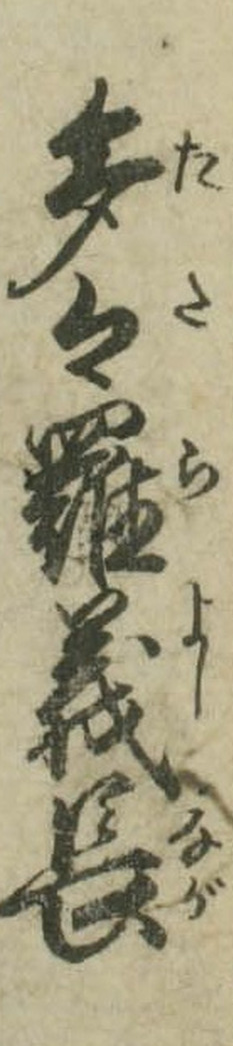多々羅義長
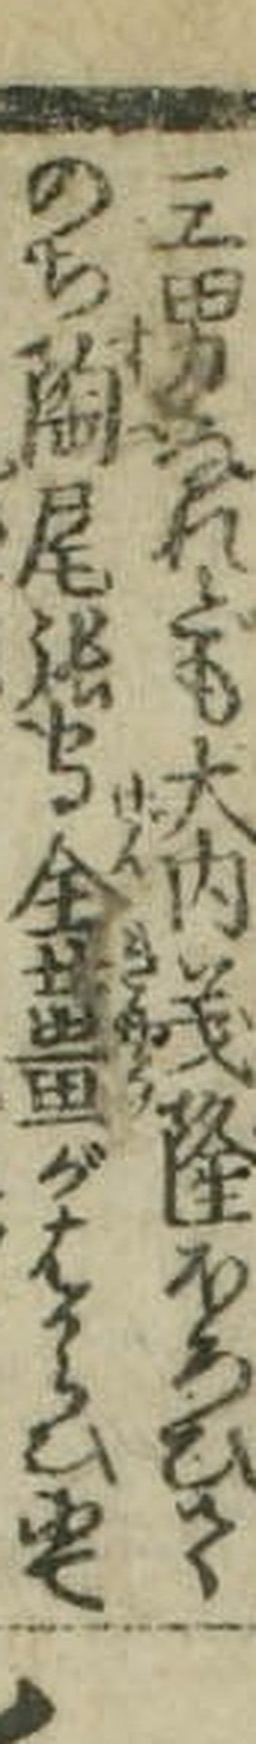のち陶尾張守全薑がはからひにて
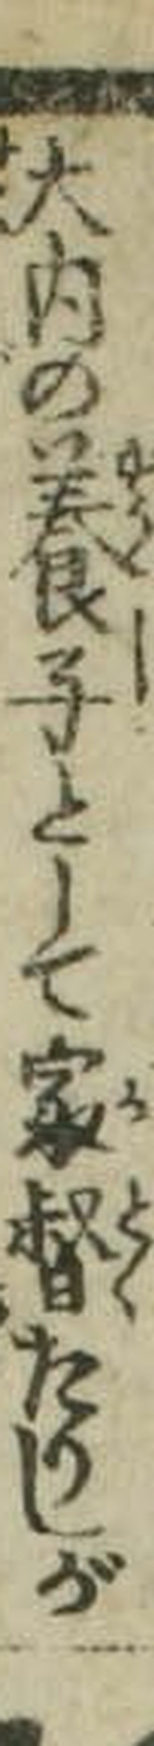大内の養子として家督たりしが
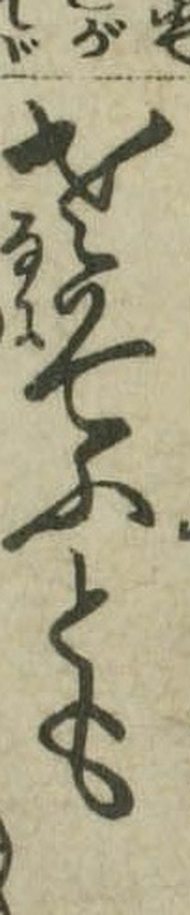さそふとも
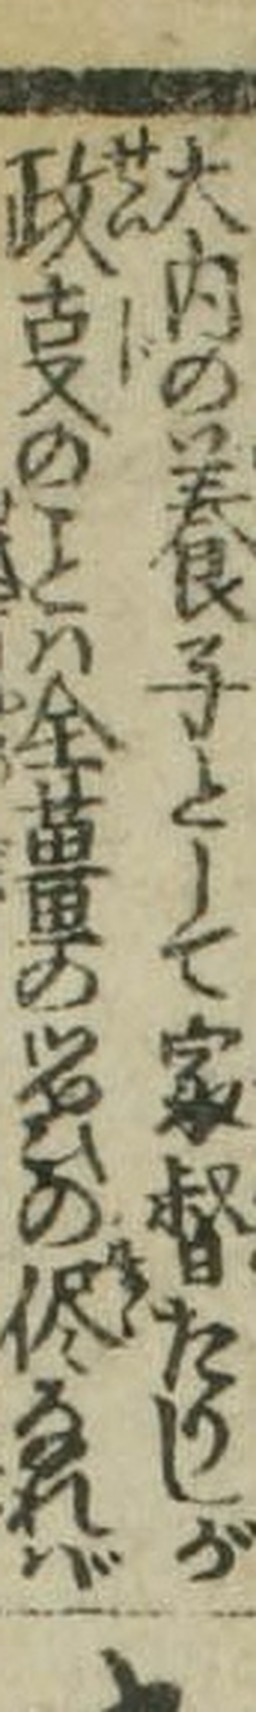政事のことは全薑の思ひの侭なれば
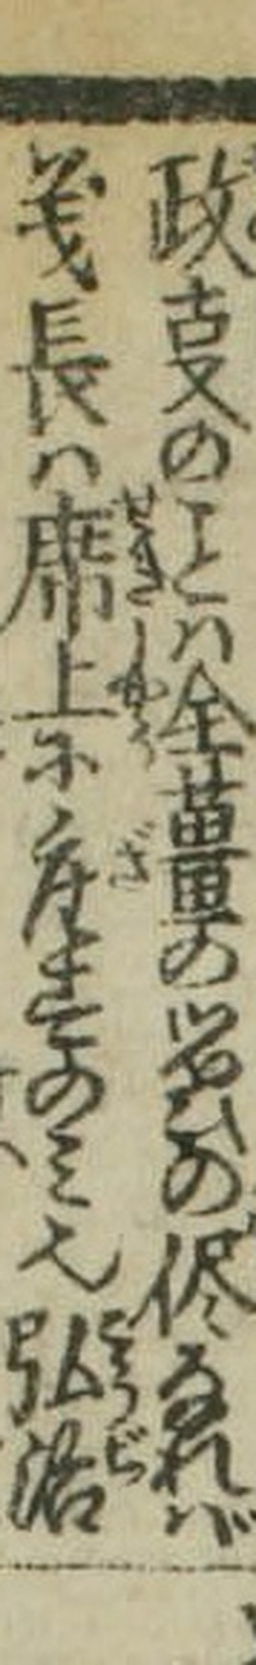義長は席上に座すのみ也弘治
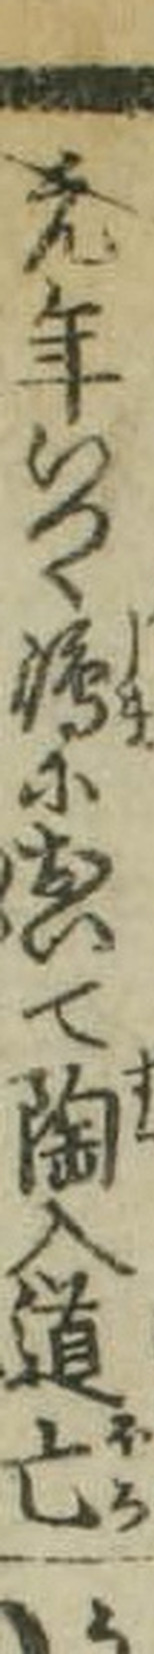元年いつく嶋において陶入道亡
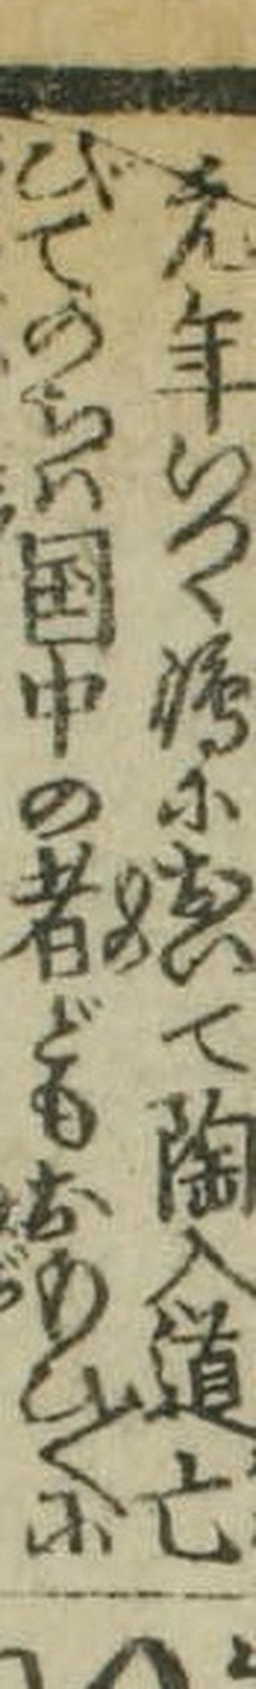びてのちは国中の者どもおもひ〳〵に
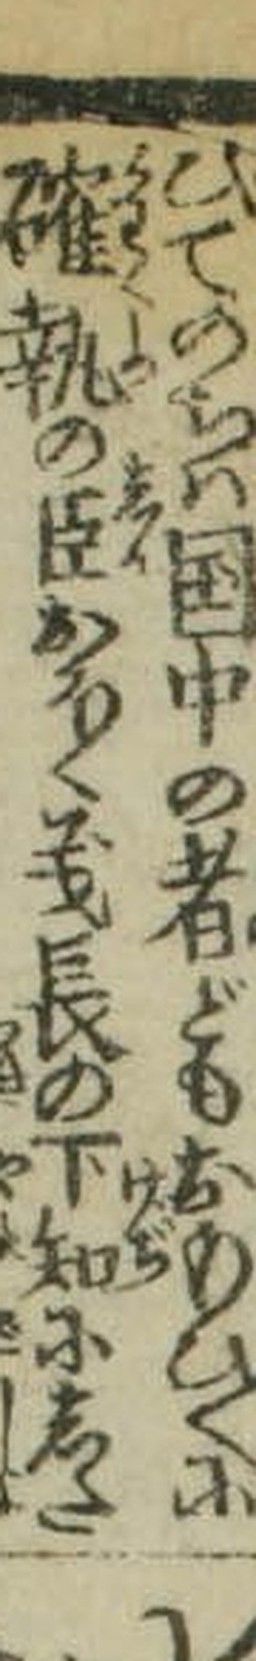確執の臣おほく義長の下知にした
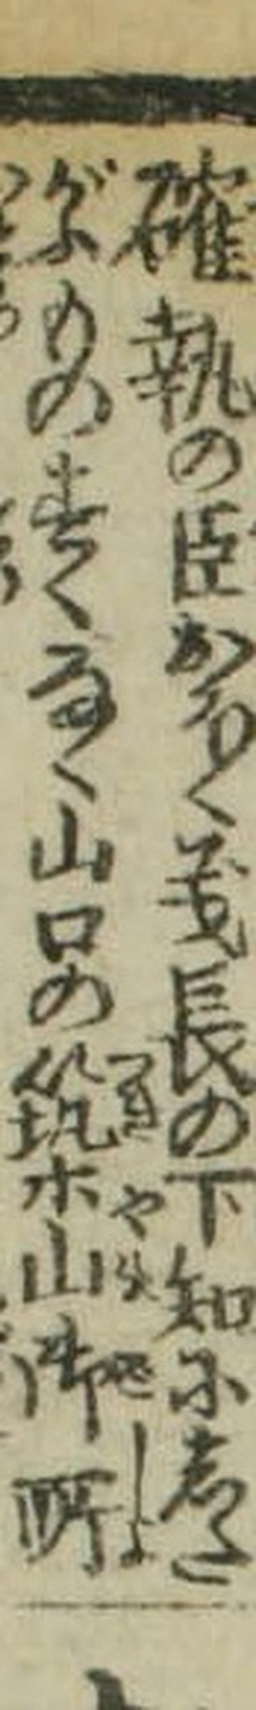がふものすくなく山口の築山御所
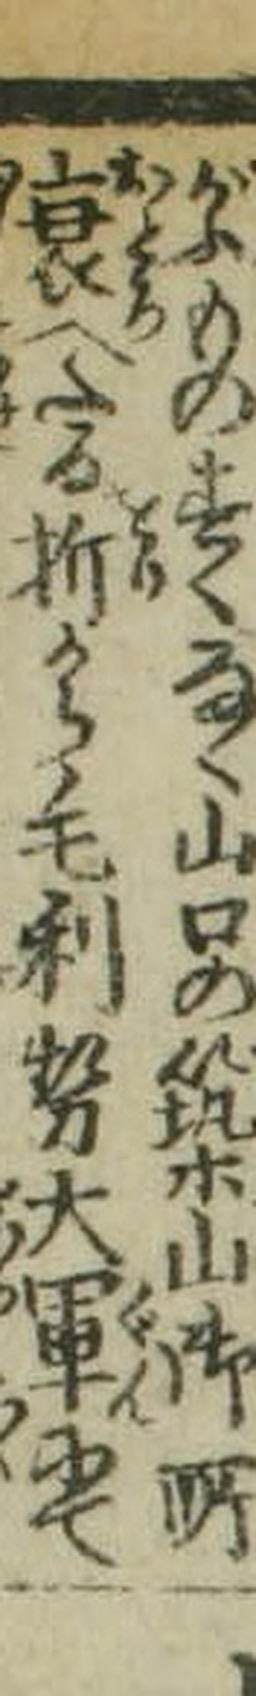衰たる折から毛利勢大軍にて
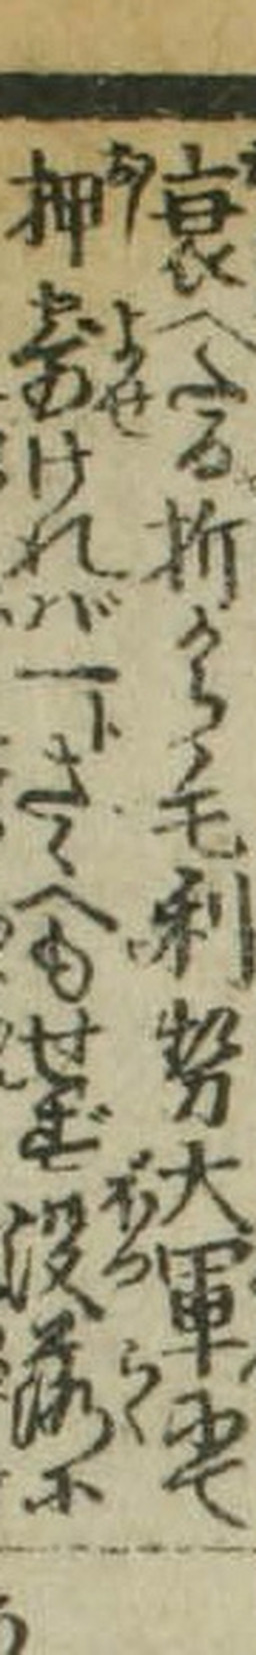押寄ければ一とさゝへもせず没落に
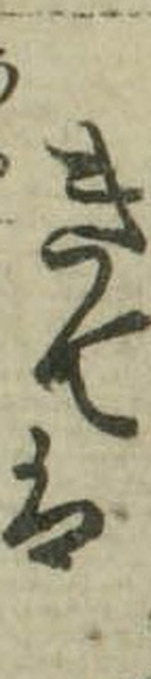きては
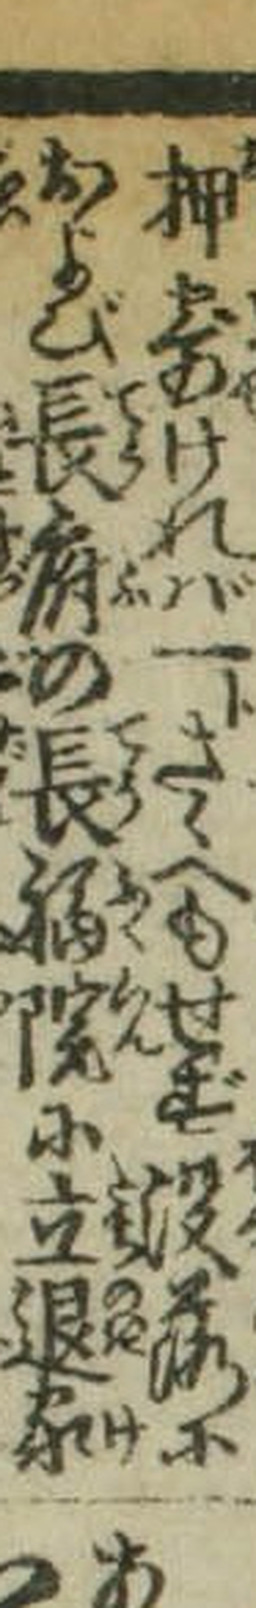および長府の長福院に立退家
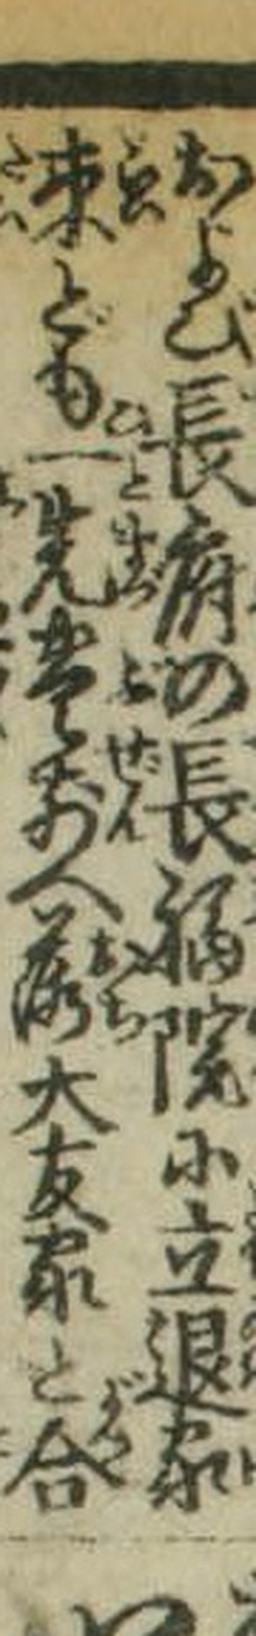来ども一先豊前へ落大友家と合
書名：續英雄百人一首
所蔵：東京学芸大学附属図書館
